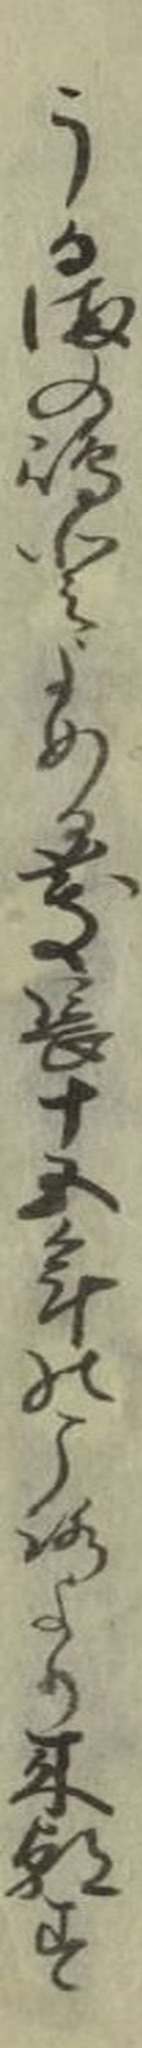うるまの嶋とよめる慶長十五年のころより来朝す
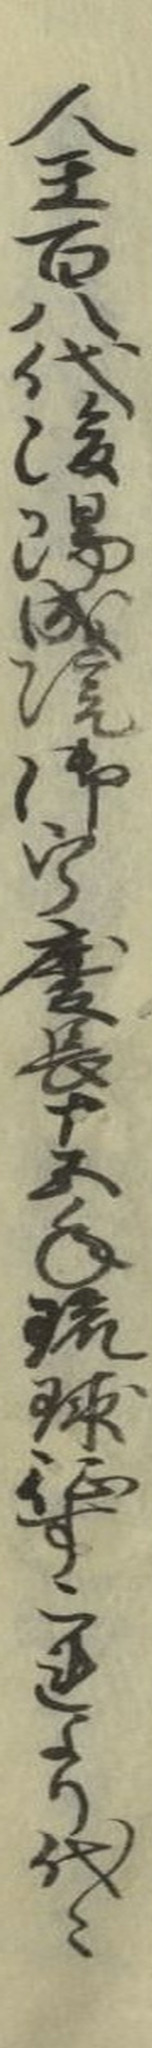人王百八代後陽成院御于慶長十五年琉球征すこれより代々
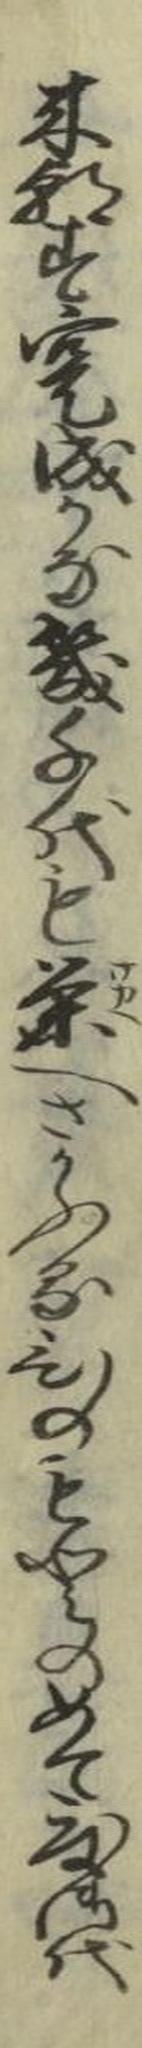来朝す寔成かな幾千代も栄へさかふるひのもとのめて度御代
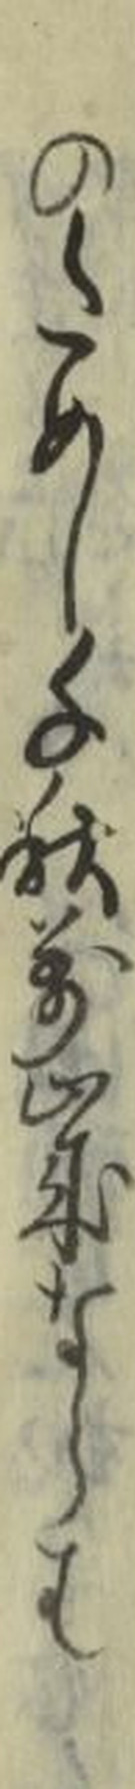のためし千秋万歳ならむ
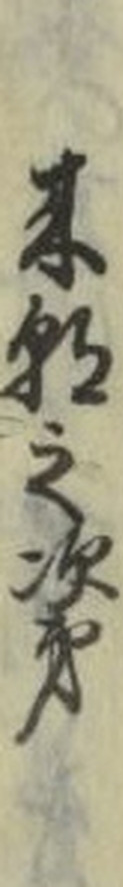来朝之次第
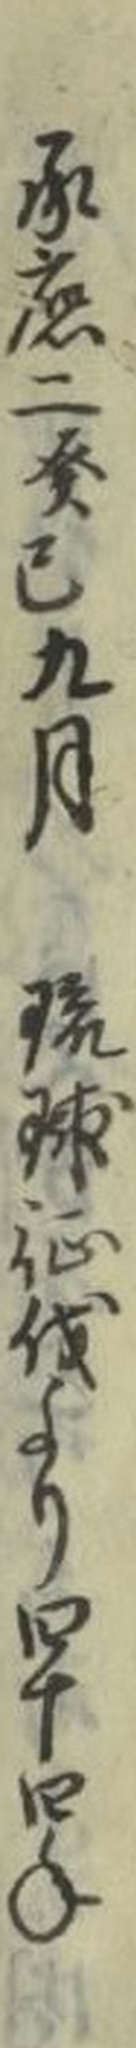承応二癸巳九月琉球征伐より四十四年
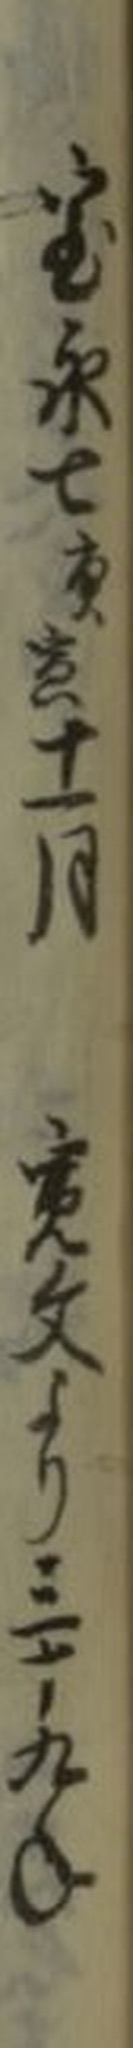宝永七庚寅十一月寛文より三十九年
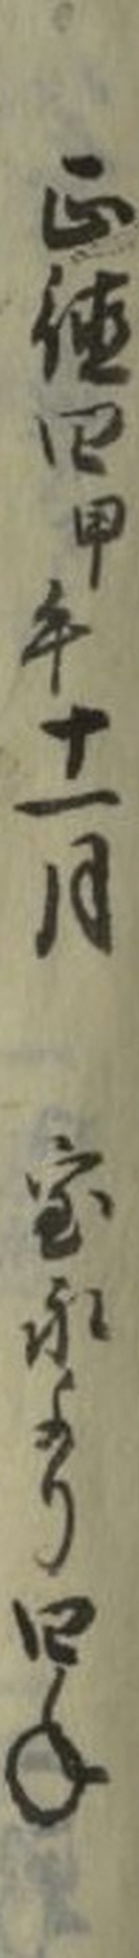正徳四申牛十一月宝永より四年
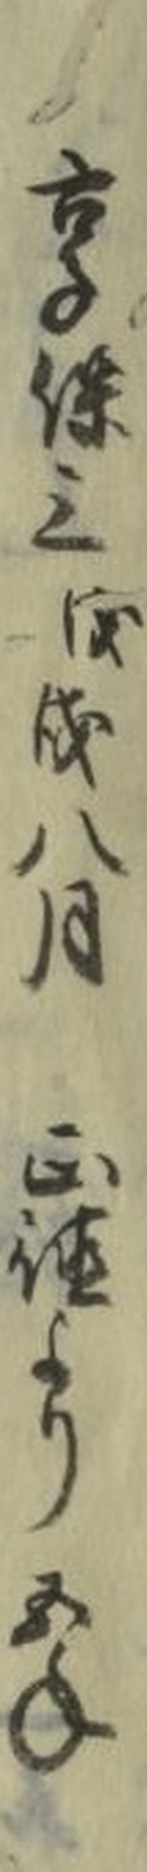享保三戊戌八月正徳より五年
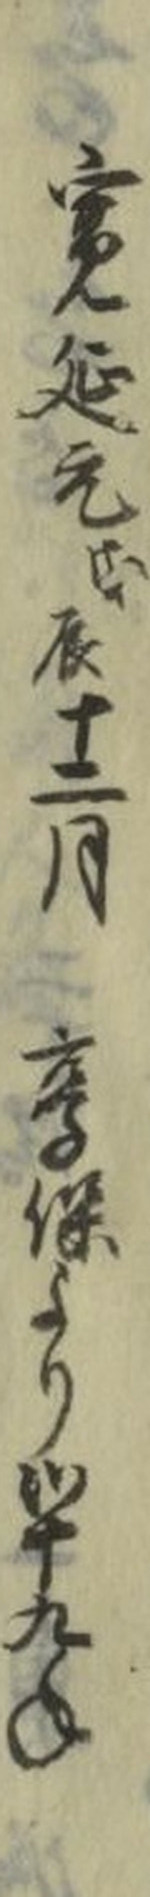寛延元戊辰十二月享保より二十九年

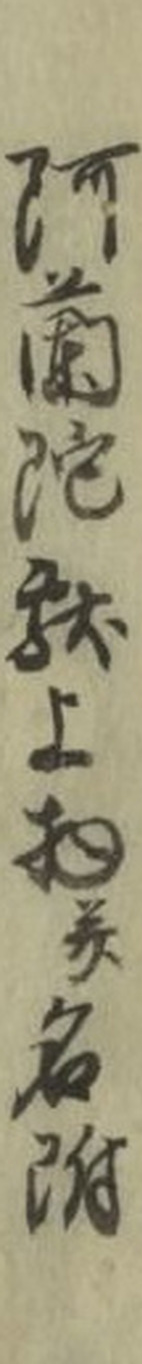阿蘭陀献上物幷名附
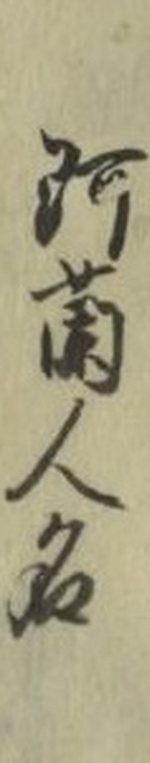阿蘭人名
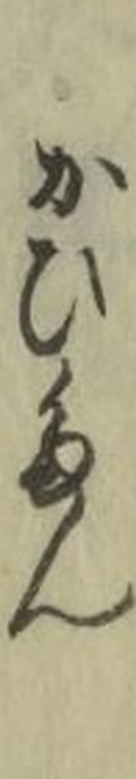かひたん
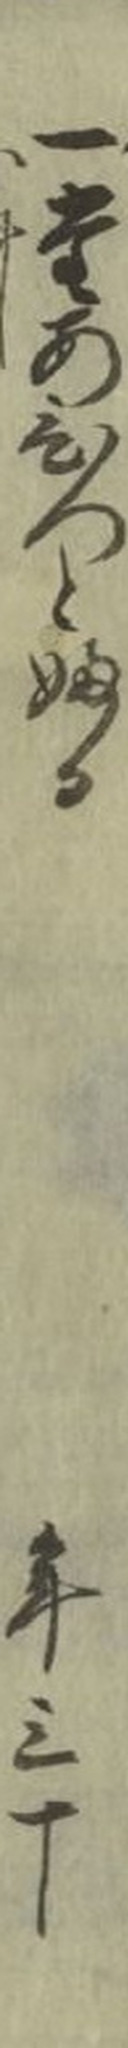一たあひつとふる年三十

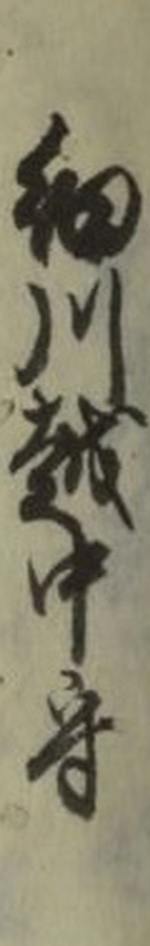細川越中守
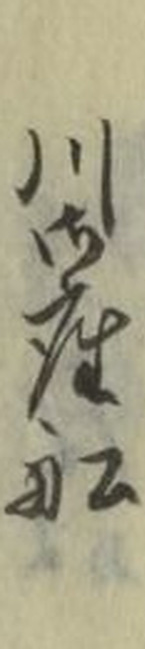川御座船
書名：琉球人来朝之記
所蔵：University of the Ryukyus Library
